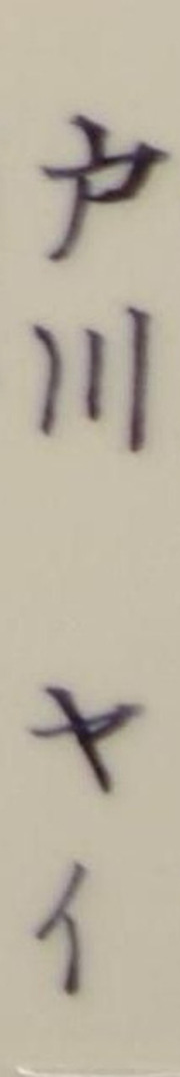戸川ヤイ
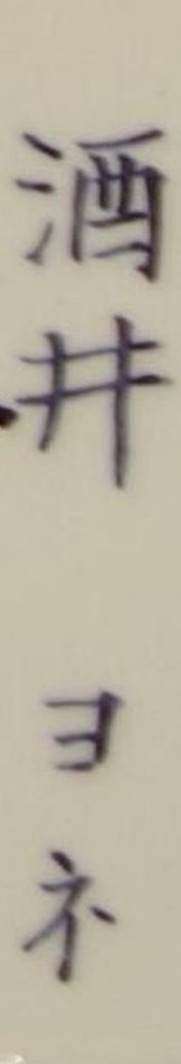酒井ヨネ
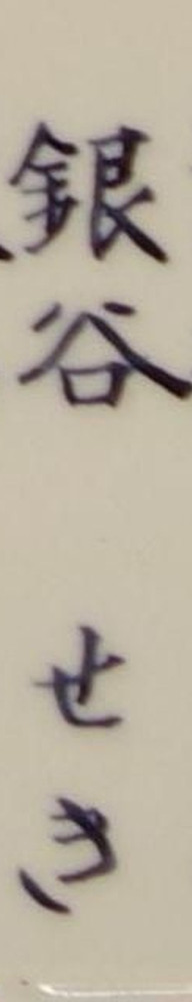銀谷せき
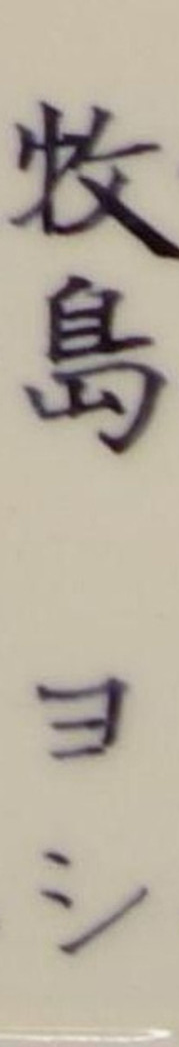牧島ヨシ
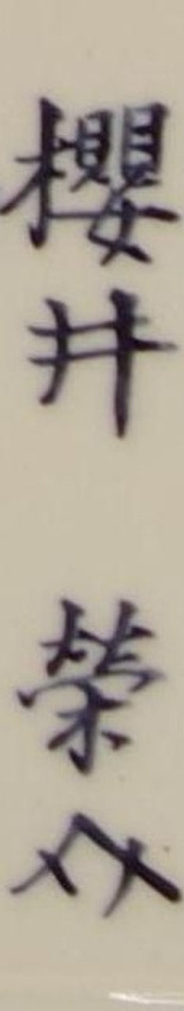桜井榮介
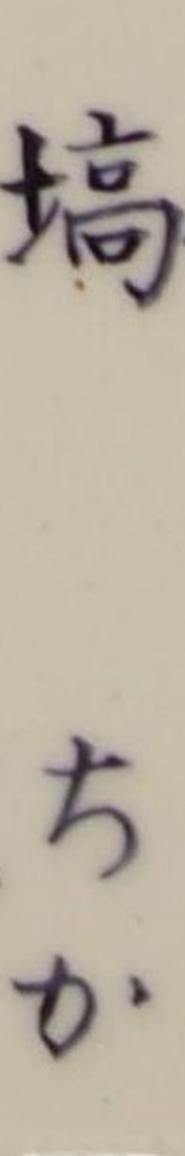塙ちか
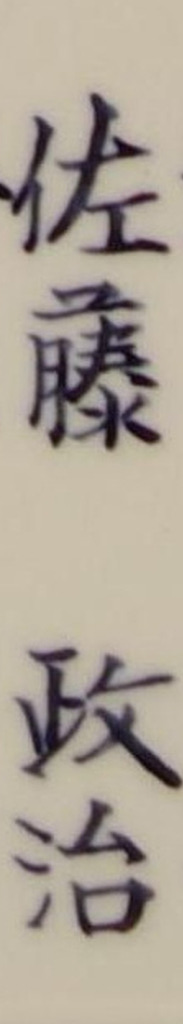佐藤政治
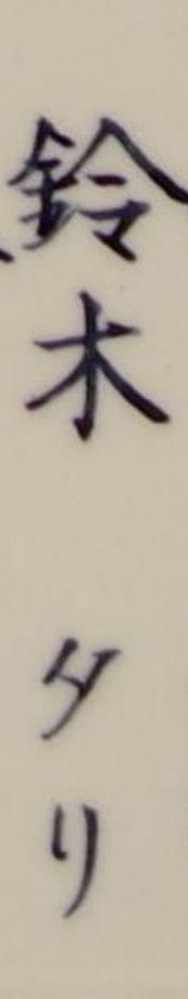鈴木タリ
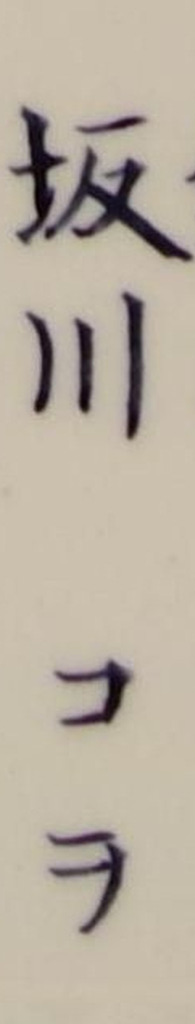坂川コヲ
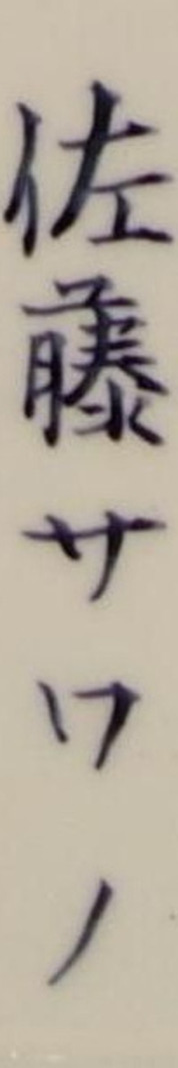佐藤サワノ
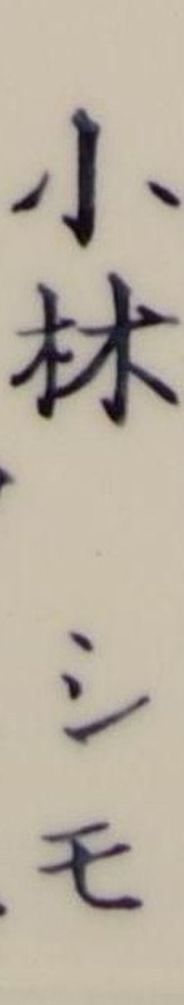小林シモ
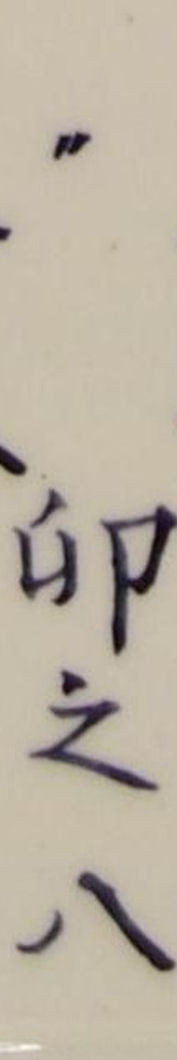卯之八
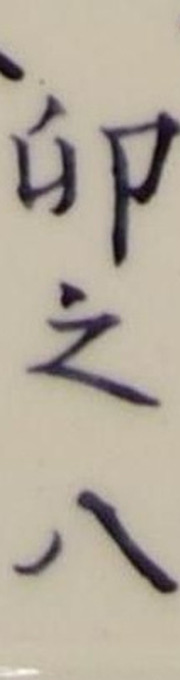卯之八
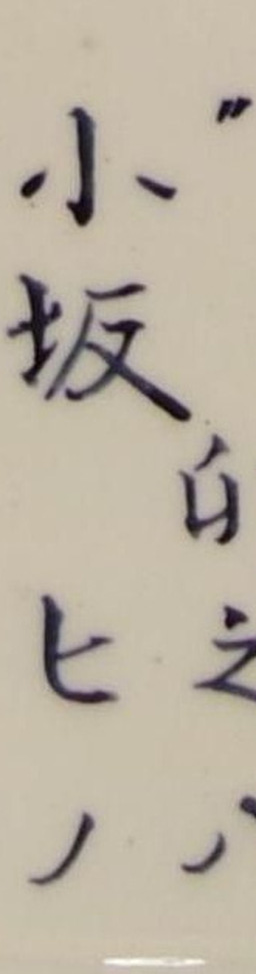小坂ヒノ
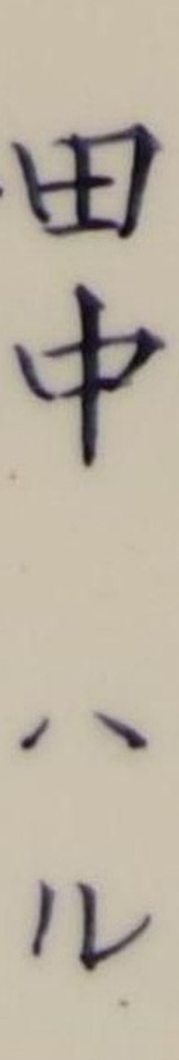田中ハル
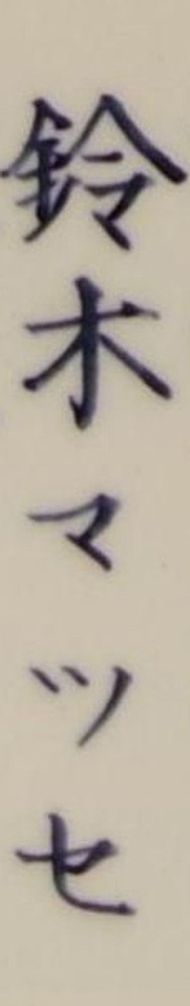鈴木マツセ
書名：M~S
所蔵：高野山金剛峯寺
